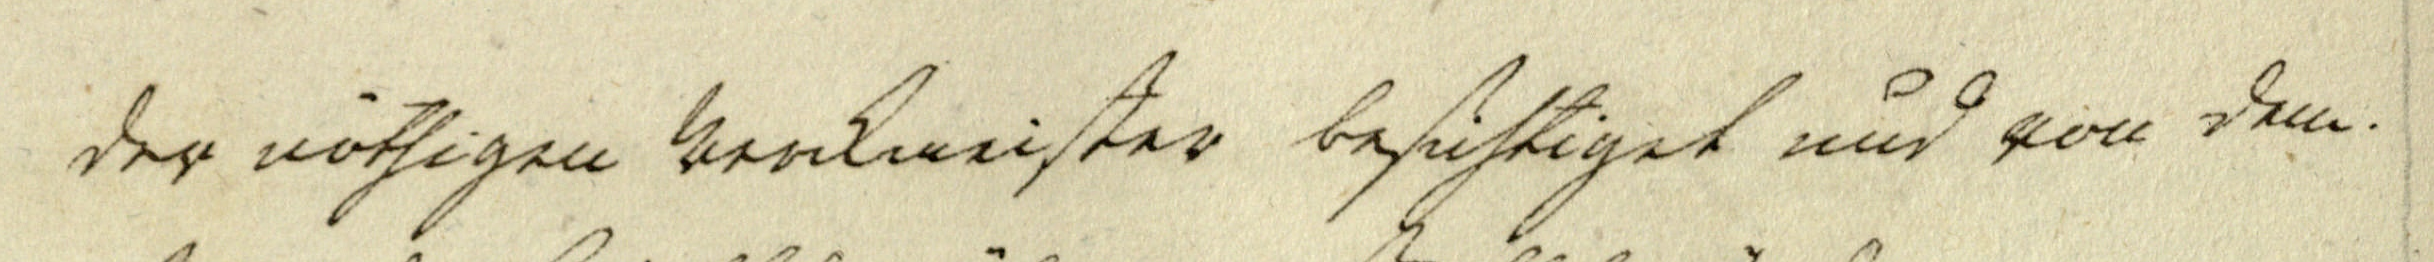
der nöthigen Werckmeister besichtiget und von dem¬
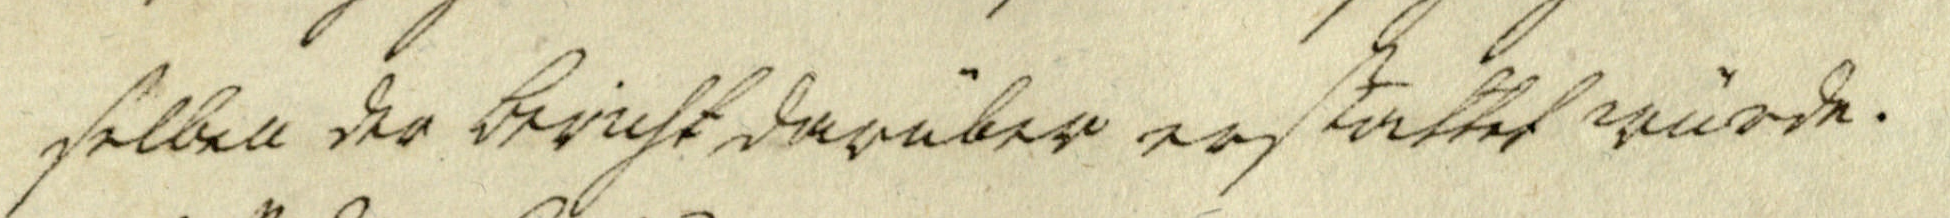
selben der Bericht darüber erstattet würde.
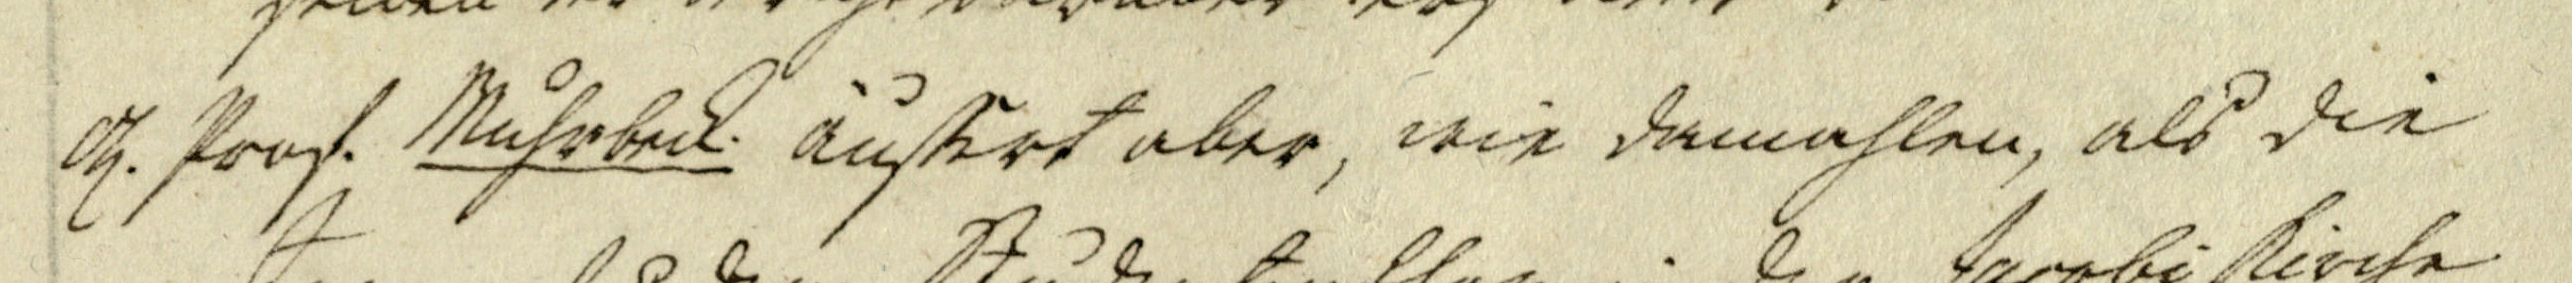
dh. Prof. Muhrbeck äussert aber, wie damahlen, als die
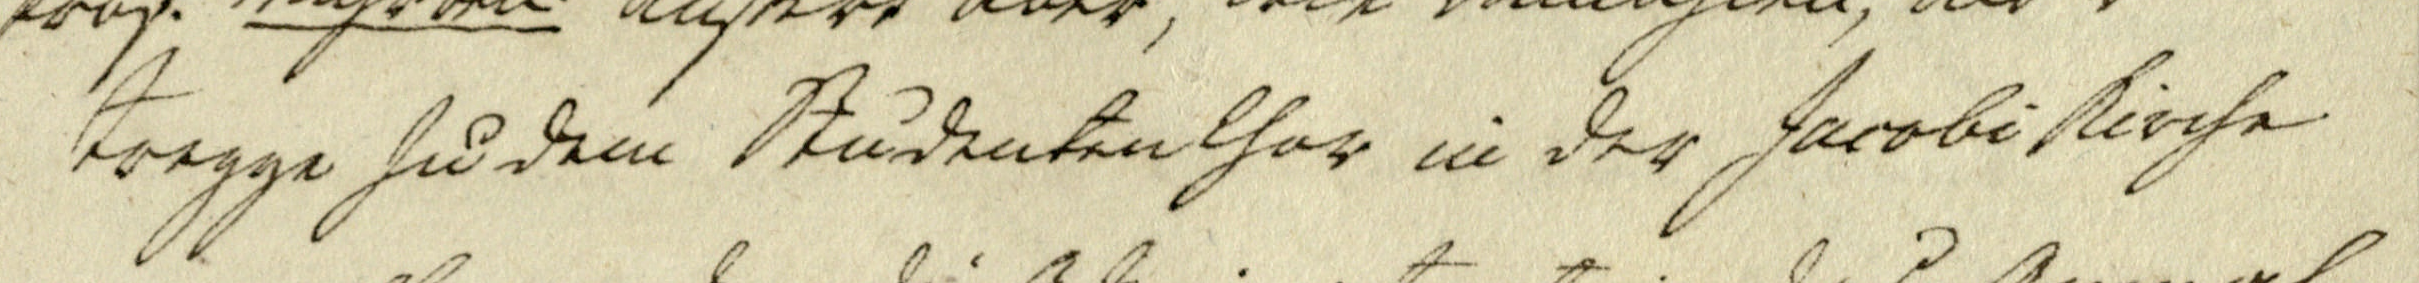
Treppe zu dem Studentenchor in der Jacobikirche
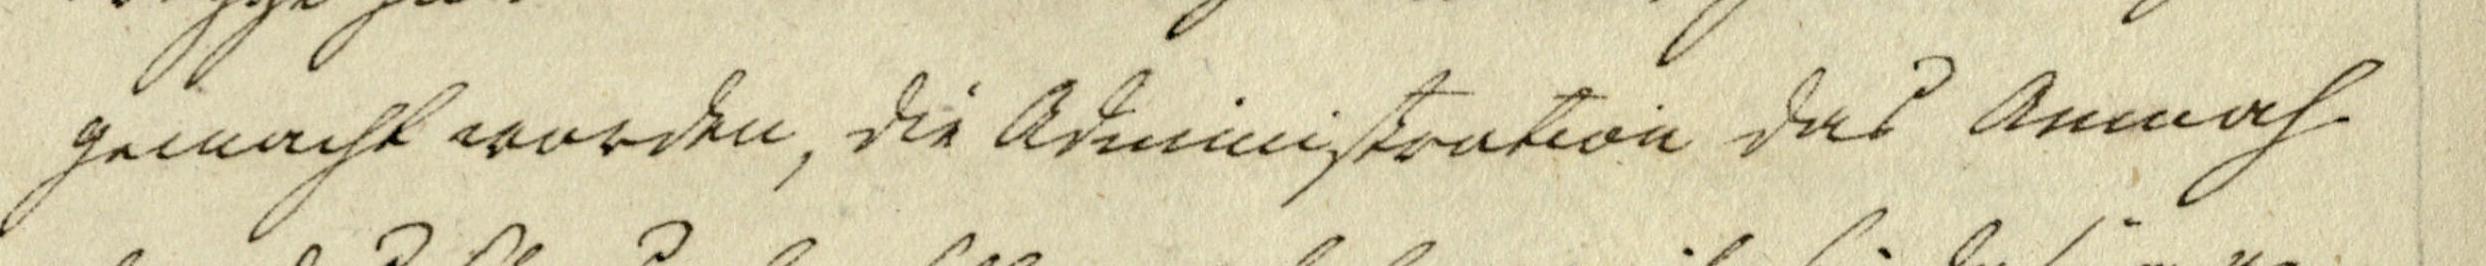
gemacht worden, die Administration das Anmah¬
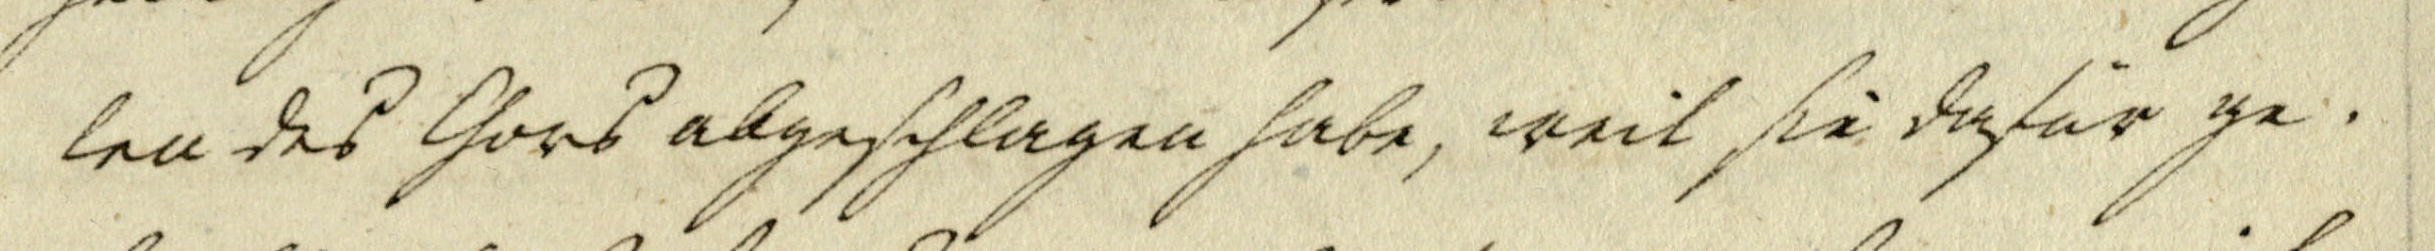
len des Chors abgeschlagen habe, weil sie dafür ge¬
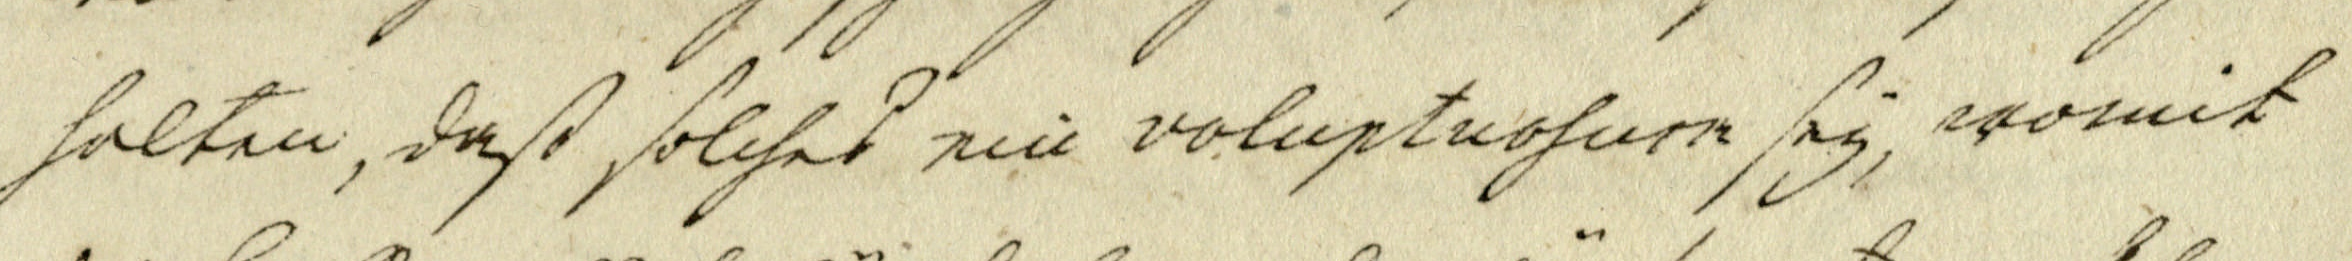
halten, daß solches ein voluptuosum seÿ, womit
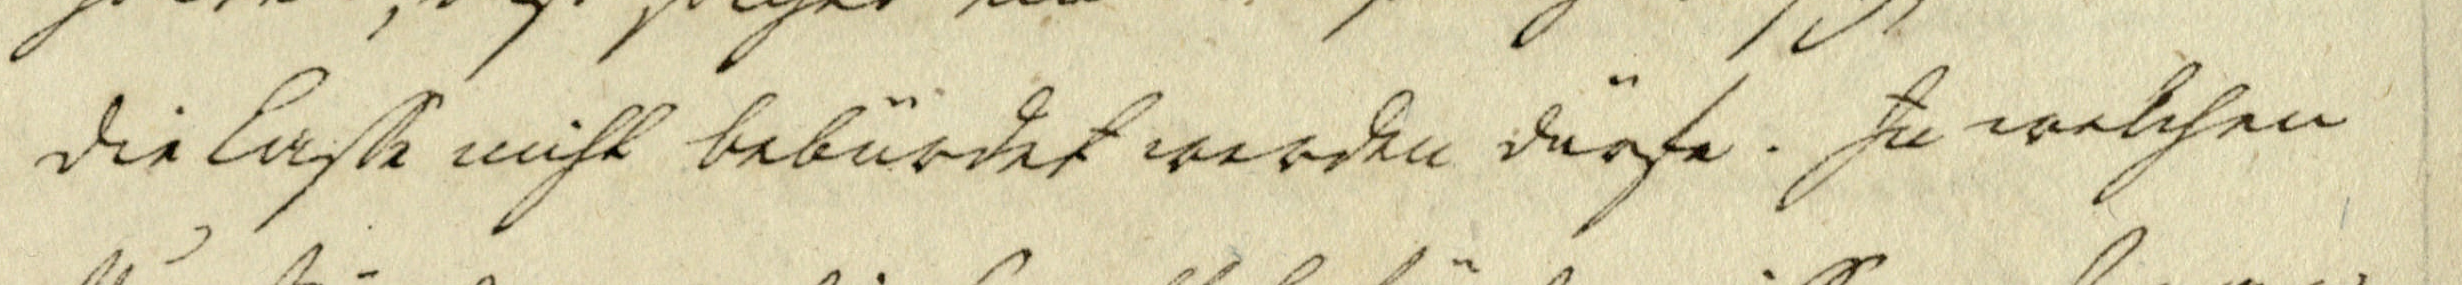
die Casse nicht bebürdet werden dürfe. In welchen
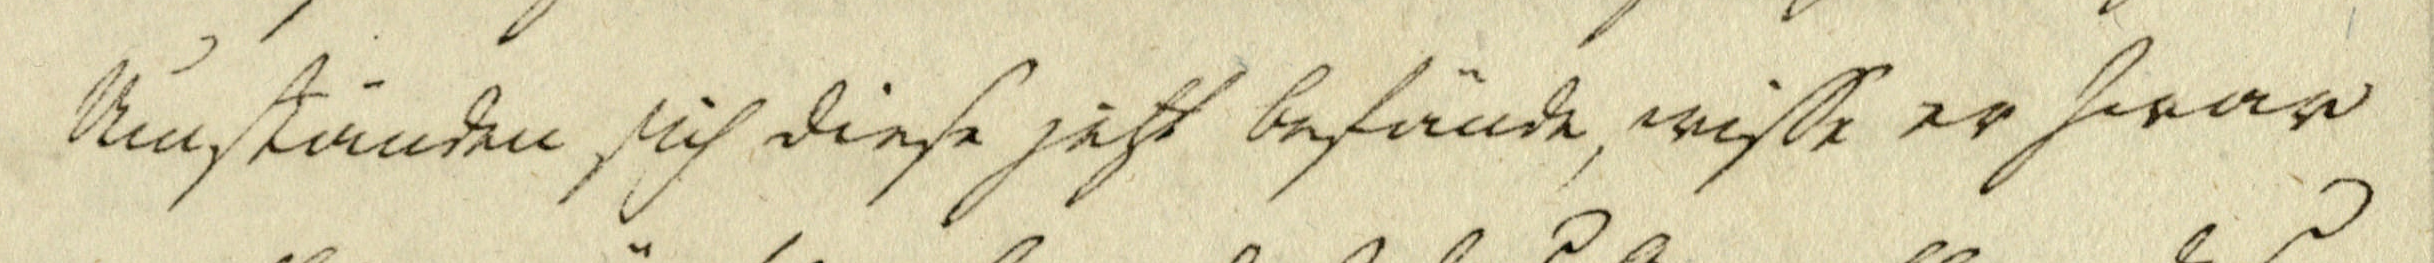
Umständen sich diese jetzt befände, wisse er zwar
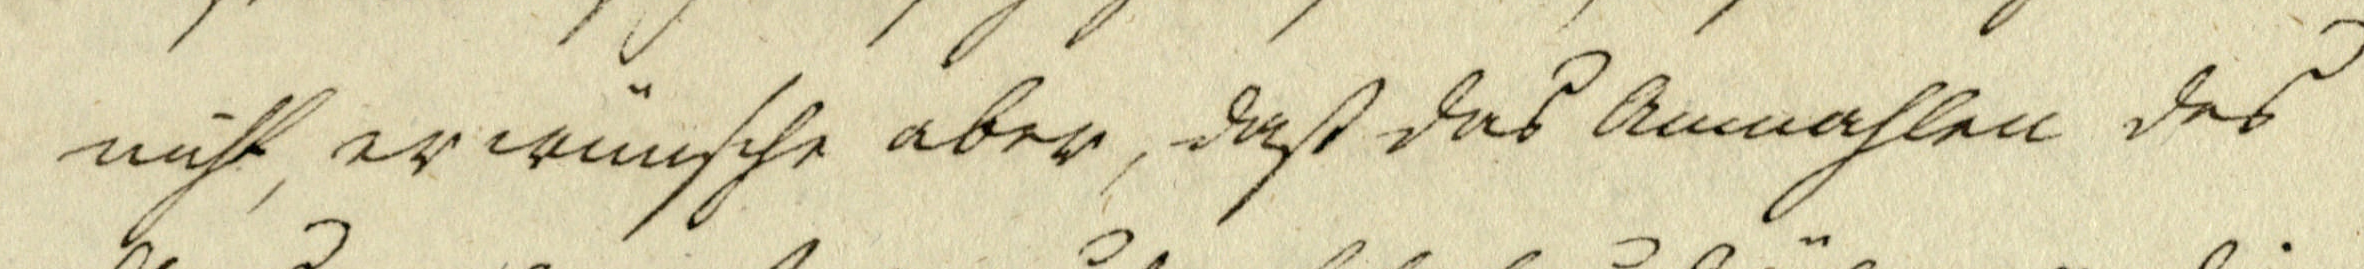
nicht, er wünsche aber, daß das Anmahlen des
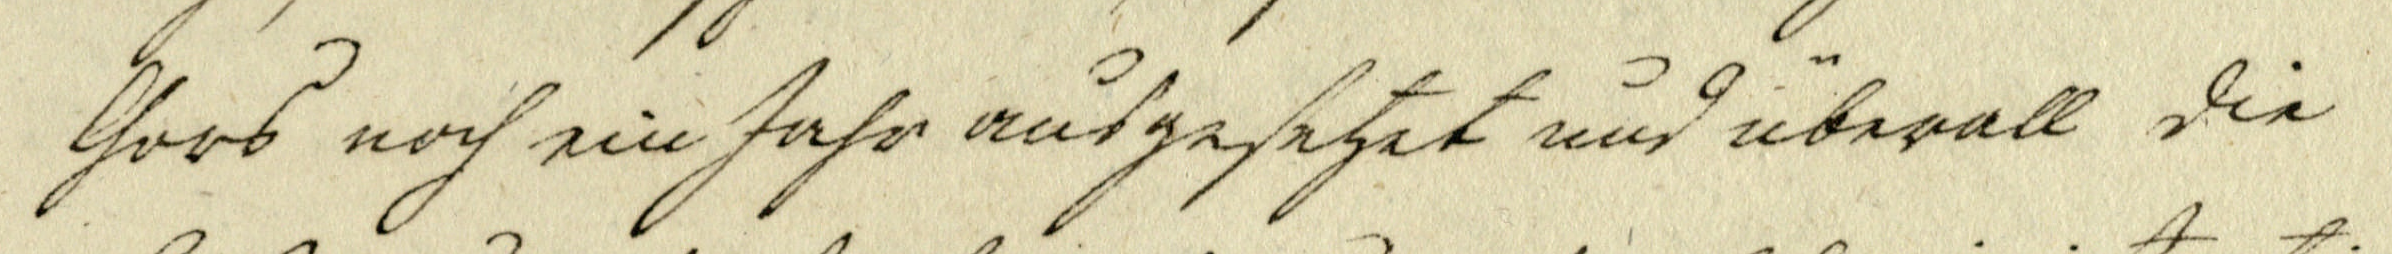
Chors noch ein Jahr ausgesetzet und überall die
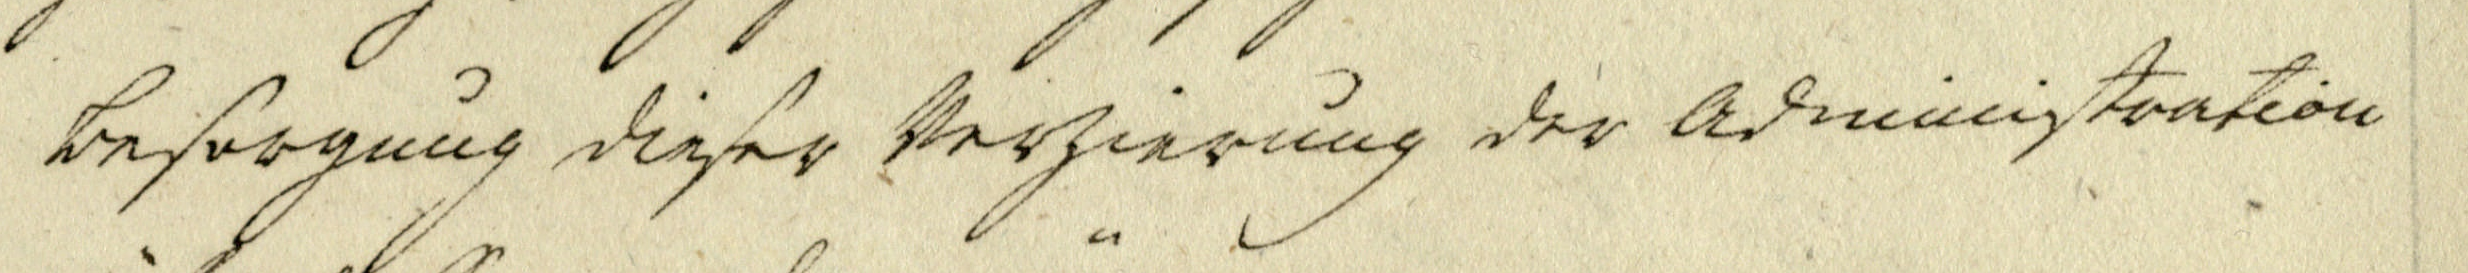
Besorgung dieser Verzierung der Administration
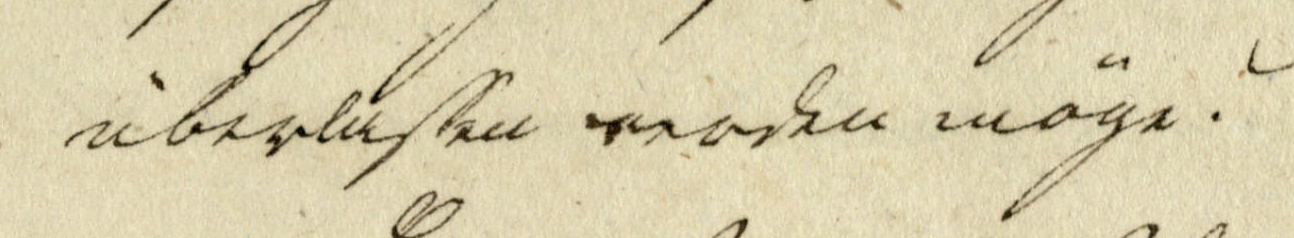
überlassen werden möge.
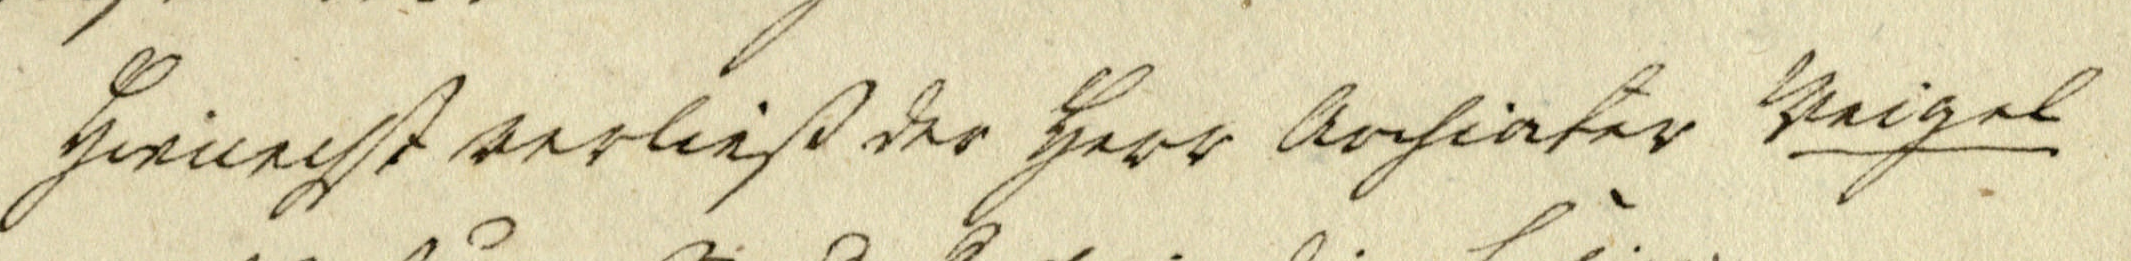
Hienechst verließ der Herr Archiater Weigel
